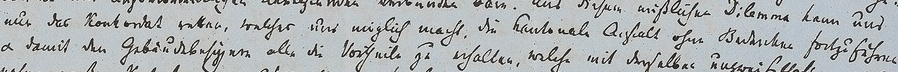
nur das Konkordat retten, welches uns möglich macht, die kantonale Anstalt ohne Bedenken fortzuführen
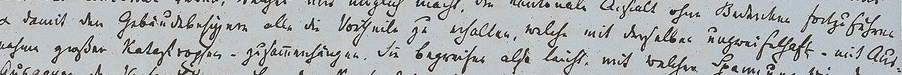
& damit den Gebäudebesitzern alle die Vortheile zu erhalten, welche mit derselben unzweifelhaft – mit Aus-
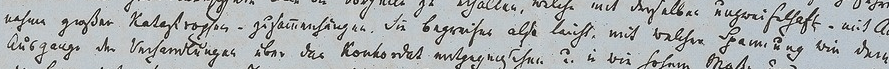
nahme großer Katastrophen – zusammenhängen. Sie begreifen also leicht, mit welcher Spannung wir dem
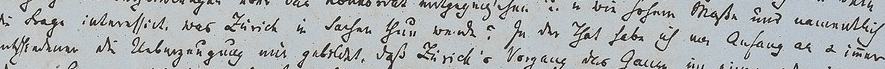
die Lage interessirt, was Zürich in Sachen thun werde? In der That habe ich von Anfang an & immer
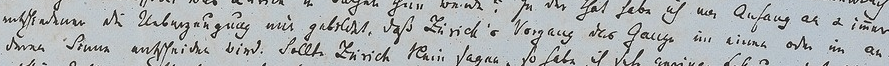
entschiedener die Ueberzeugung mir gebildet, daß Zürich's Vorgang das Ganze im einen oder im an-
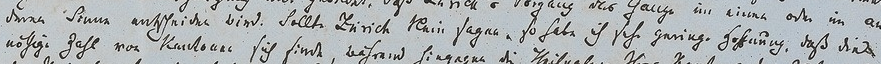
deren Sinne entscheiden wird. Sollte Zürich Nein sagen, so habe ich sehr geringe Hoffnung, daß die
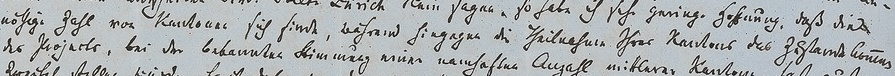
nöthige Zahl von Kantonen sich finde, während hingegen die Theilnahme Ihres Kantons das Zustandekommen
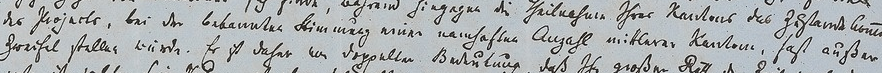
des Projects, bei der bekannten Stimmung einer namhaften Anzahl mittlerer Kantone, fast außer
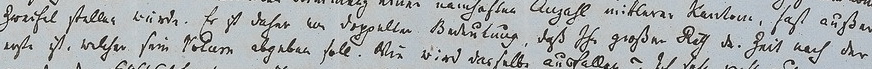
Zweifel stellen würde. Es ist daher von doppelter Bedeutung, daß Ihr großer Rath d. Zeit nach der
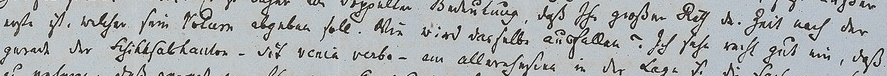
erste ist, welcher sein Votum abgeben soll. Wie wird dasselbe ausfallen? Ich sehe recht gut ein, daß
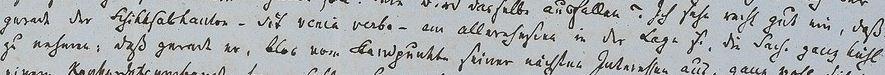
gerade der Schikksalskanton – sit venia verbo – am allerehesten in der Lage ist, die Sache ganz kühl
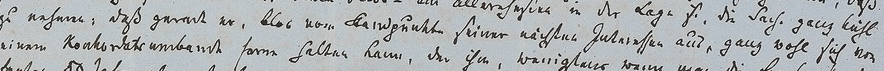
zu nehmen, daß gerade er, blos vom Standpunkte seiner nächsten Interessen aus, ganz wohl sich von
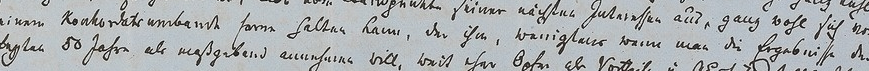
einem Konkordatsverbande ferne halten kann, der ihm, wenigstens wenn man die Ergebnisse der
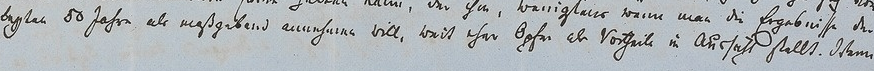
letzten 50 Jahre als maßgebend annehmen will, weit eher Opfer als Vortheile in Aussicht stellt. Wenn
